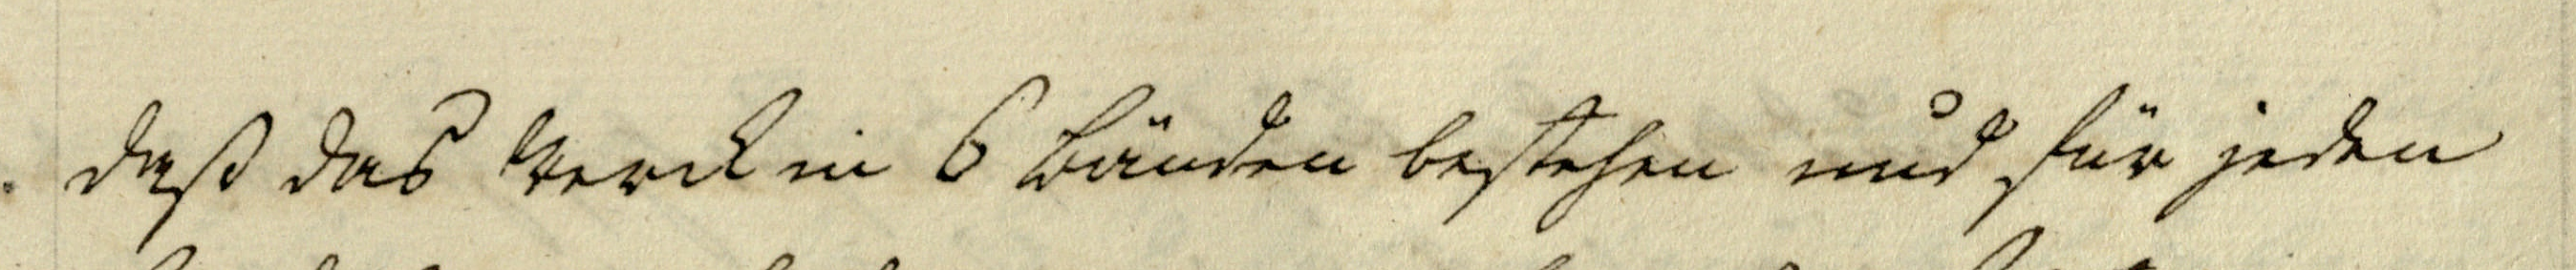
daß das Werck in 6 Bänden bestehen und für jeden
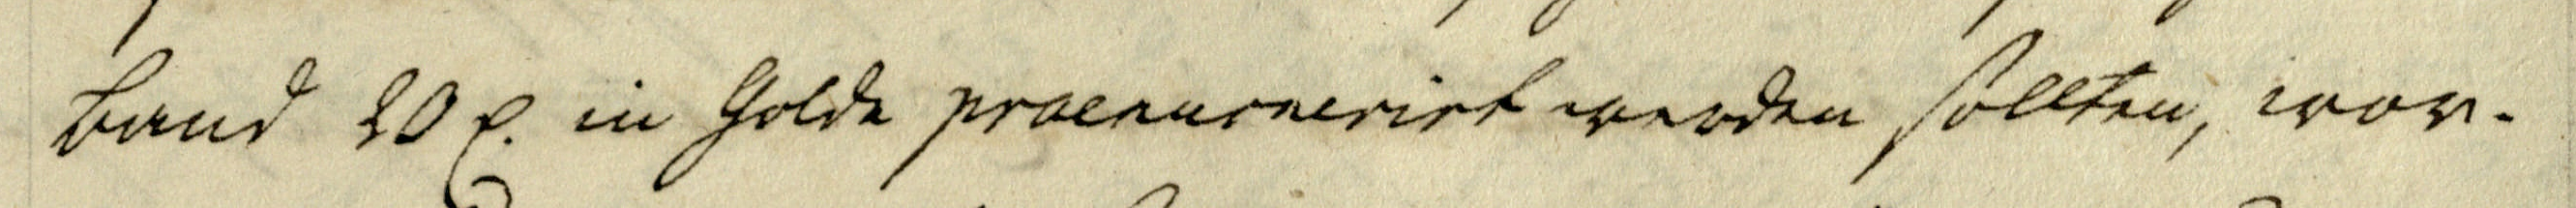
Band 20 l. in Golde praenumerirt werden sollten, wor¬
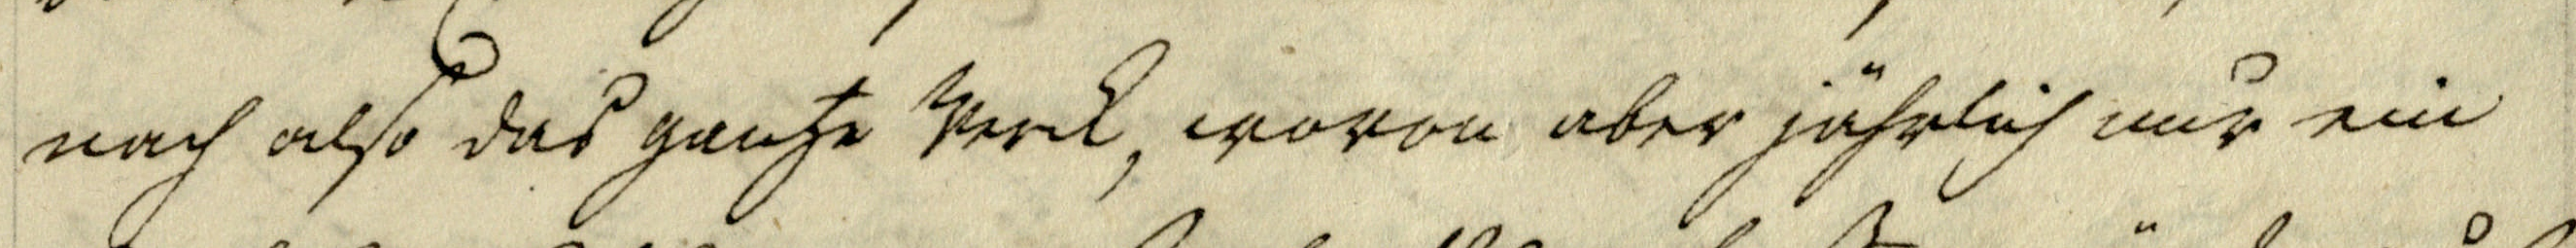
nach also das gantze Werck, wovon aber jährlich nur ein
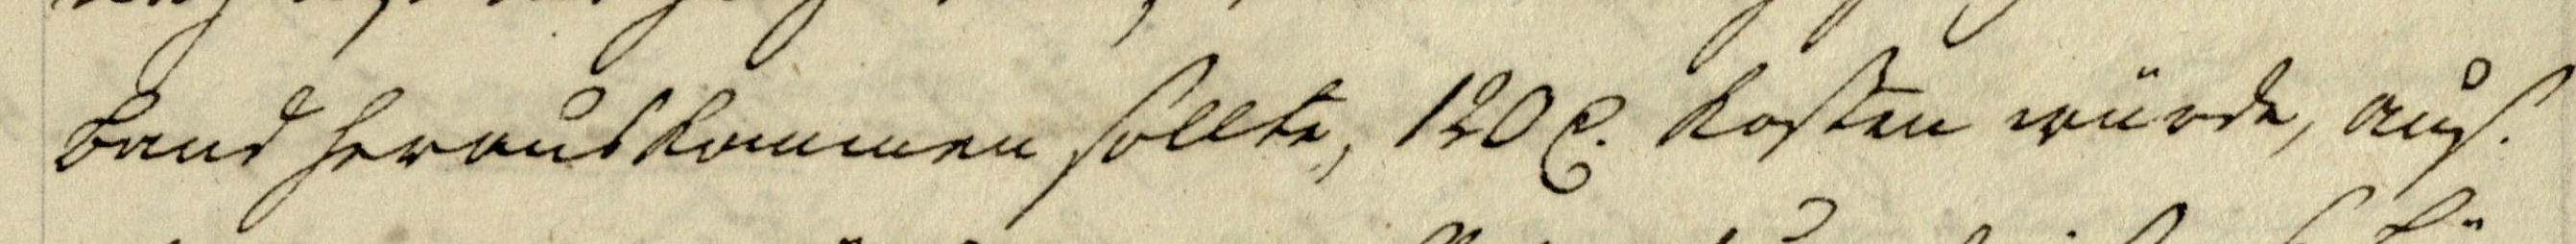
Band herauskommen sollte, 120 l. kosten würde, aus¬
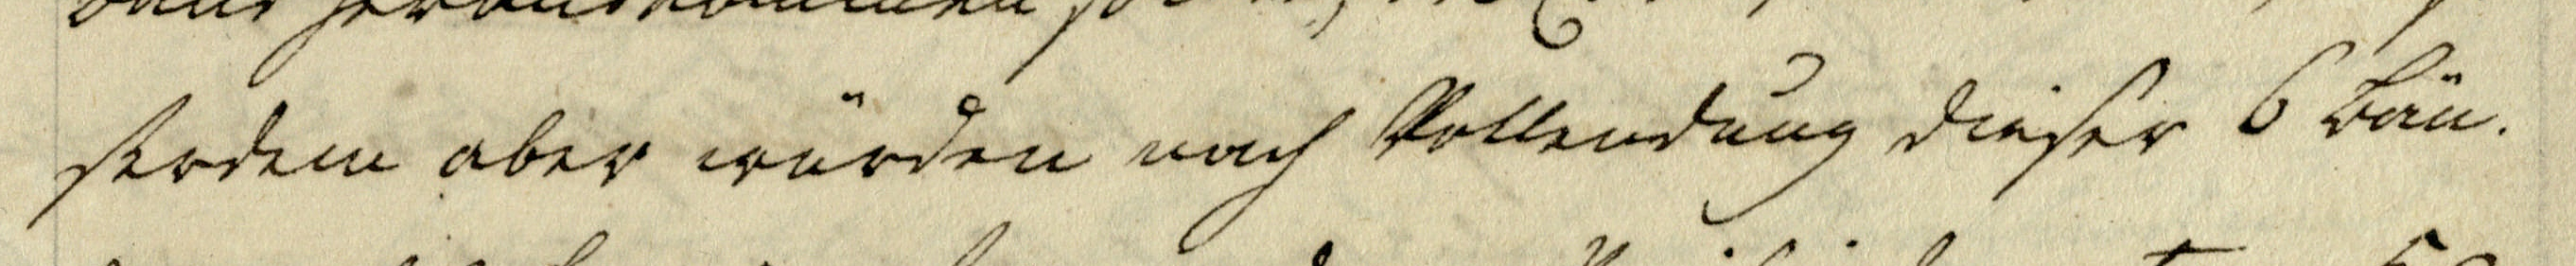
serdem aber würden nach Vollendung dieser 6 Bän¬
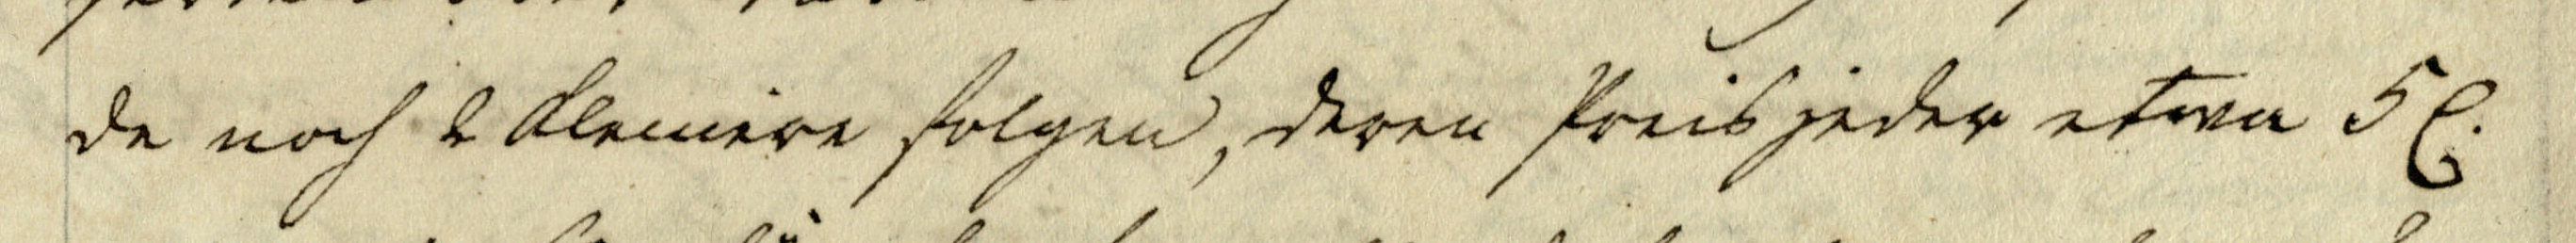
de noch 2 kleinere folgen, deren Preis jeder etwa 5 l.
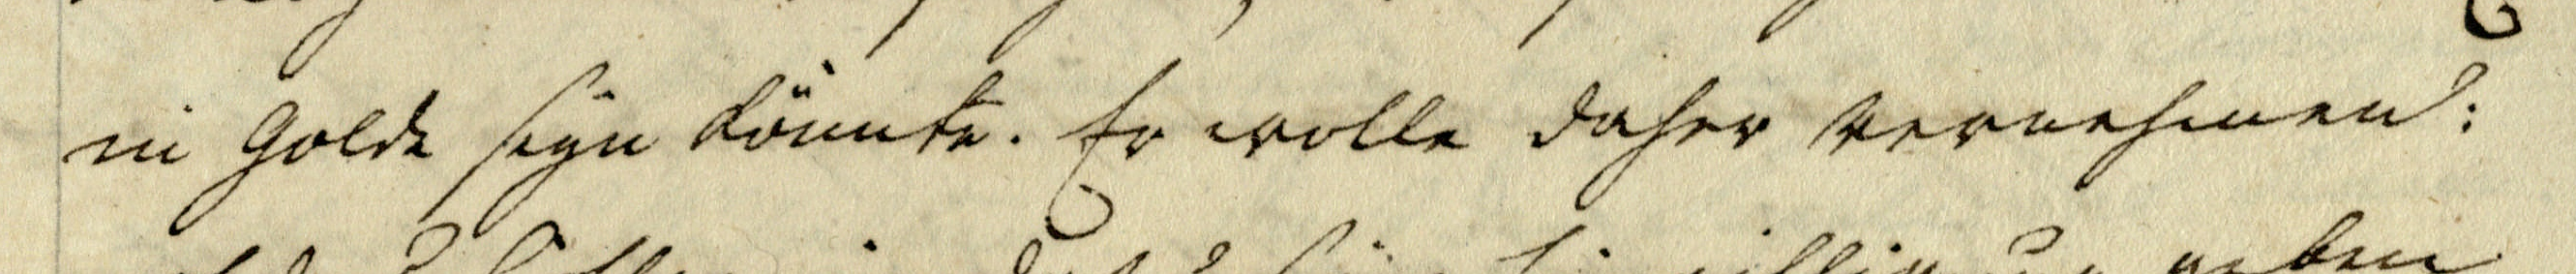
in Golde seÿn könnte. Er wolle daher vernehmen:
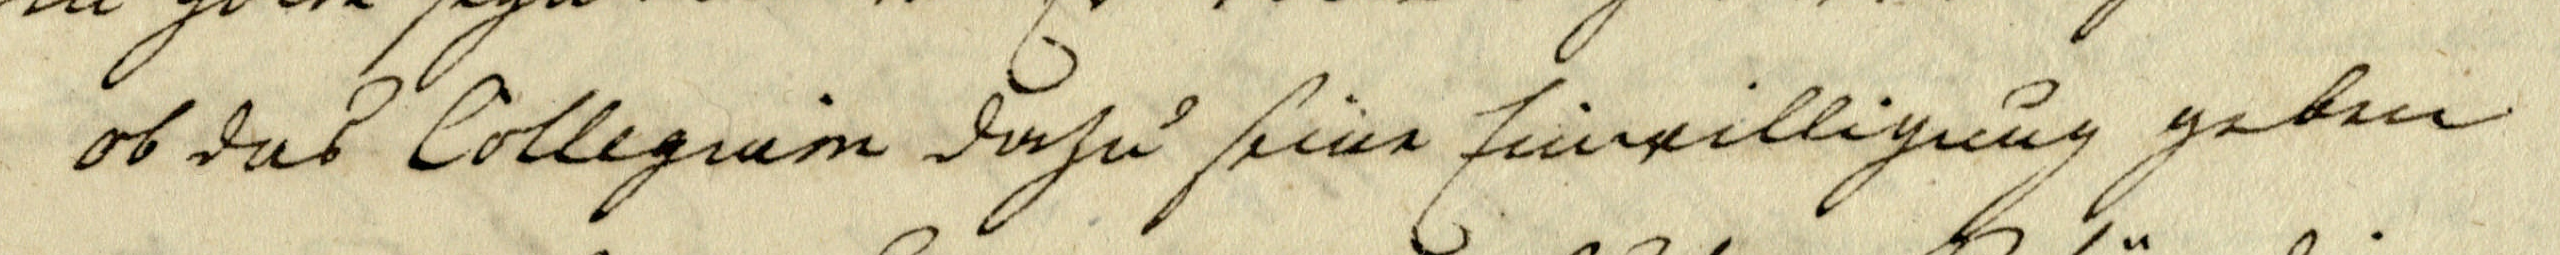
ob das Collegium dazu seine Einwilligung geben
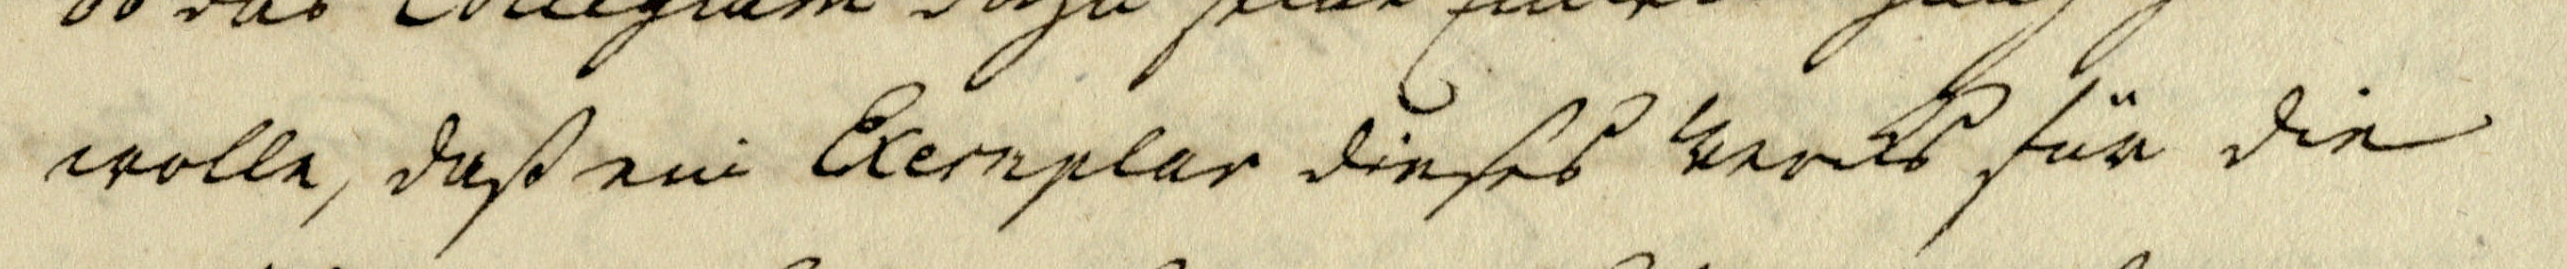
wolle, daß ein Exemplar dieses Wercks für die
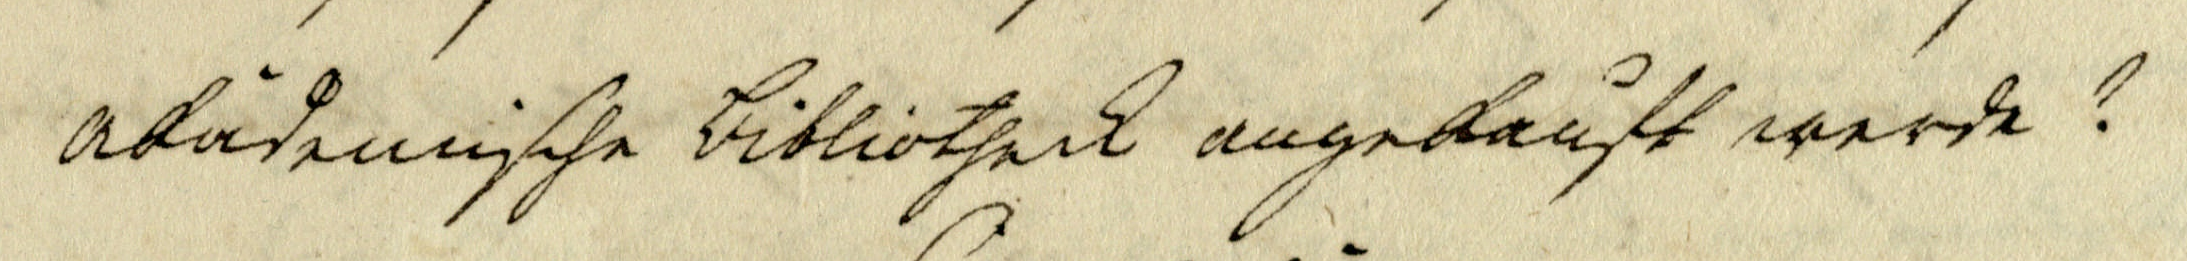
akademische Bibliotheck angekauft werde?
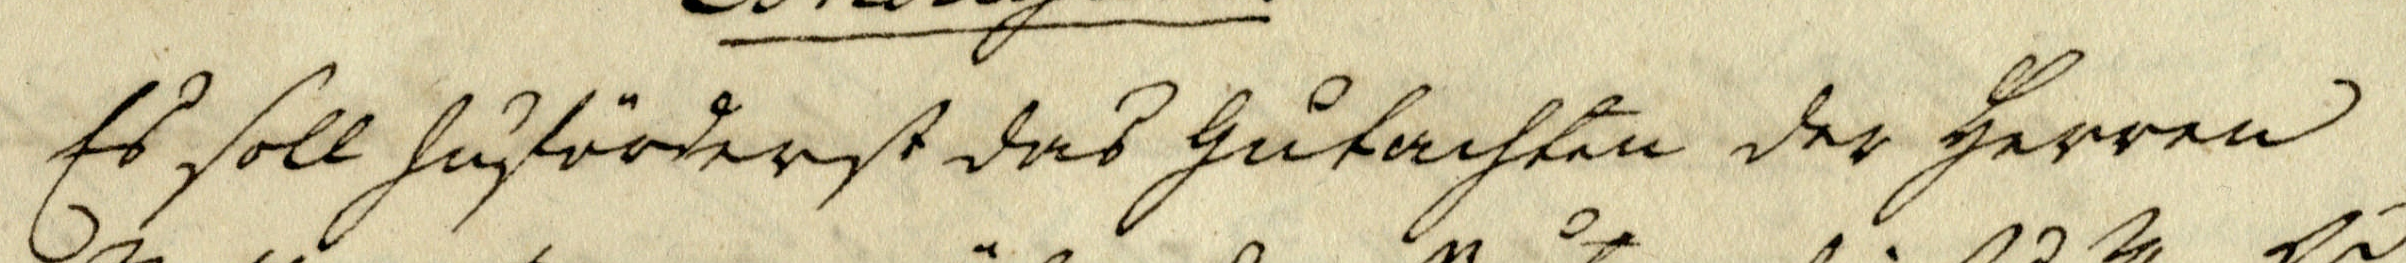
Es soll zuförderst das Gutachten der Herren
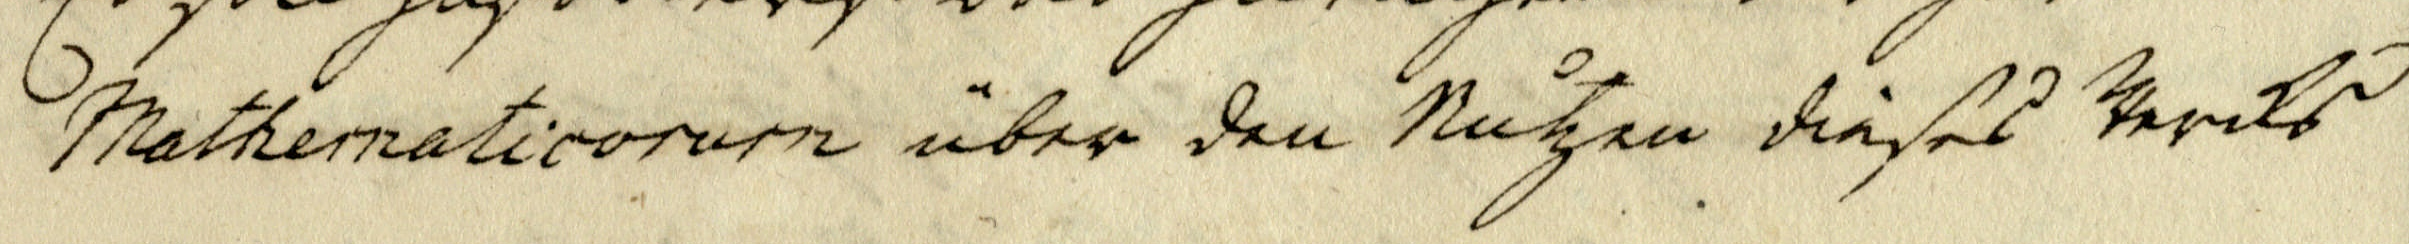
Mathematicorum über den Nutzen dieses Wercks
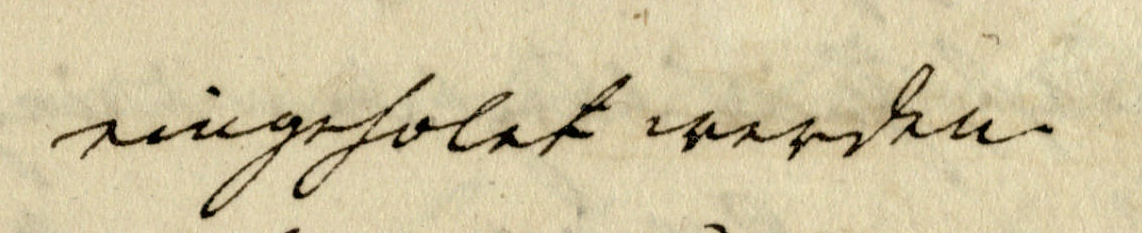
eingeholet werden.
